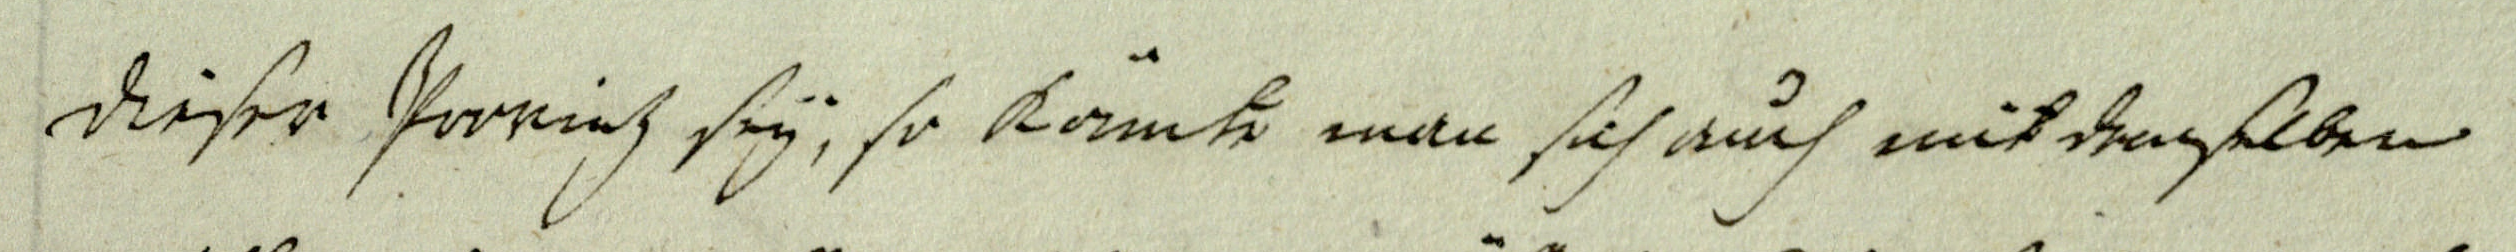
dieser Provinz seÿ, so könnte man sich auch mit demselben
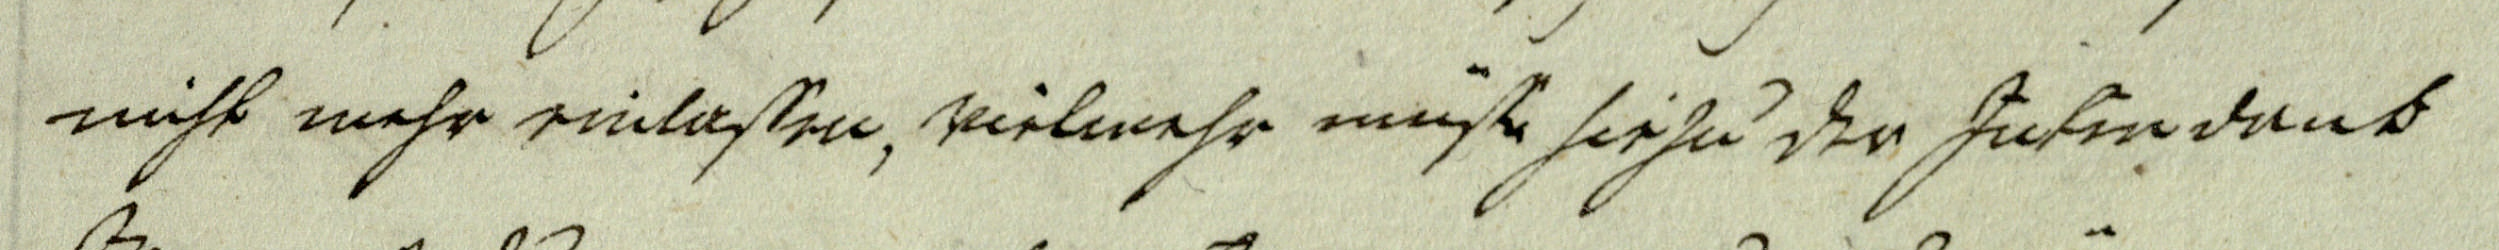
nicht mehr einlassen, vielmehr müsse hiezu der Intendant
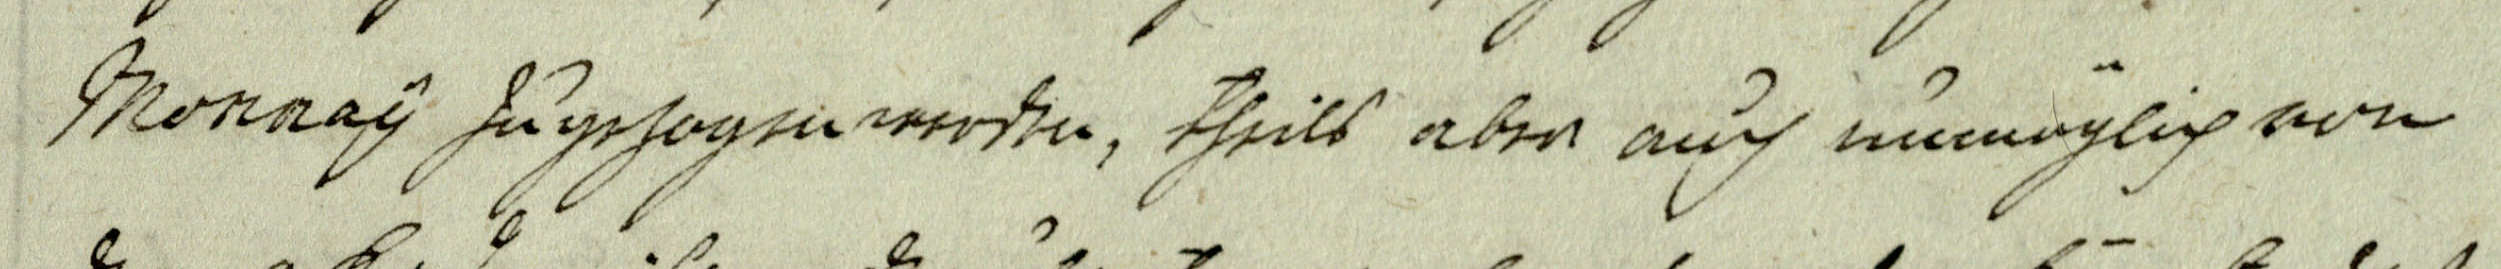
Monnaÿ zugezogen werden, theils aber auch unmöglich von
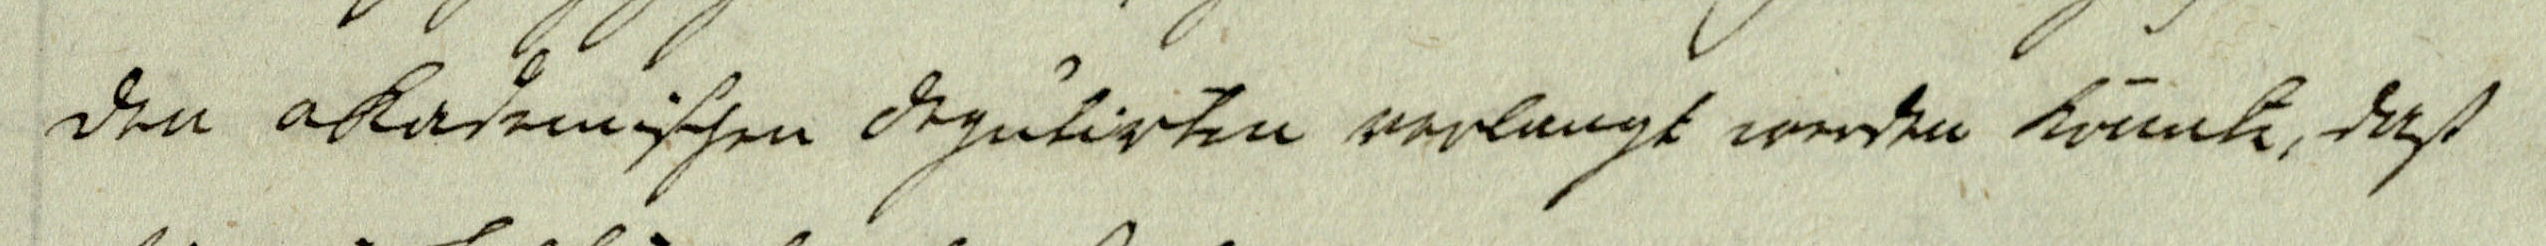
den akademischen Deputirten verlangt werden könnte, daß
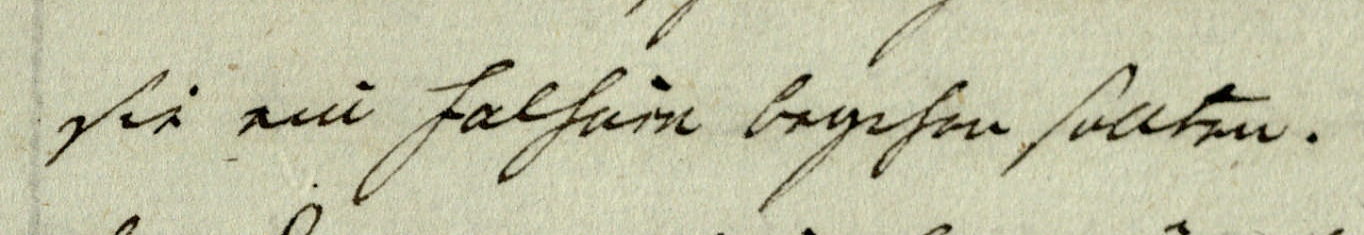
sie ein Falsum begehen sollten.
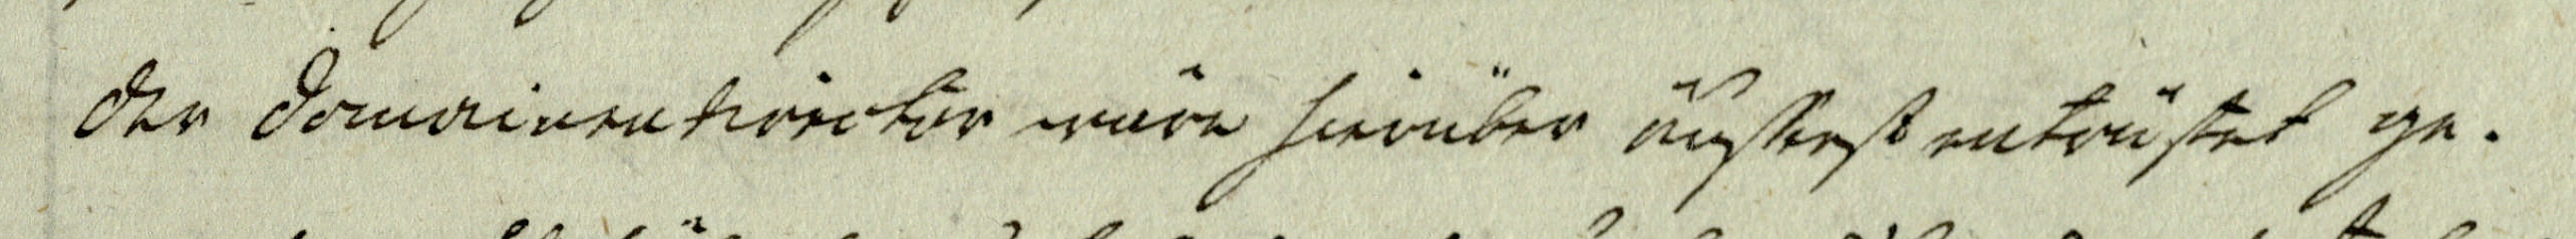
Der Domainendirector wäre hierüber äusserst entrüstet ge¬
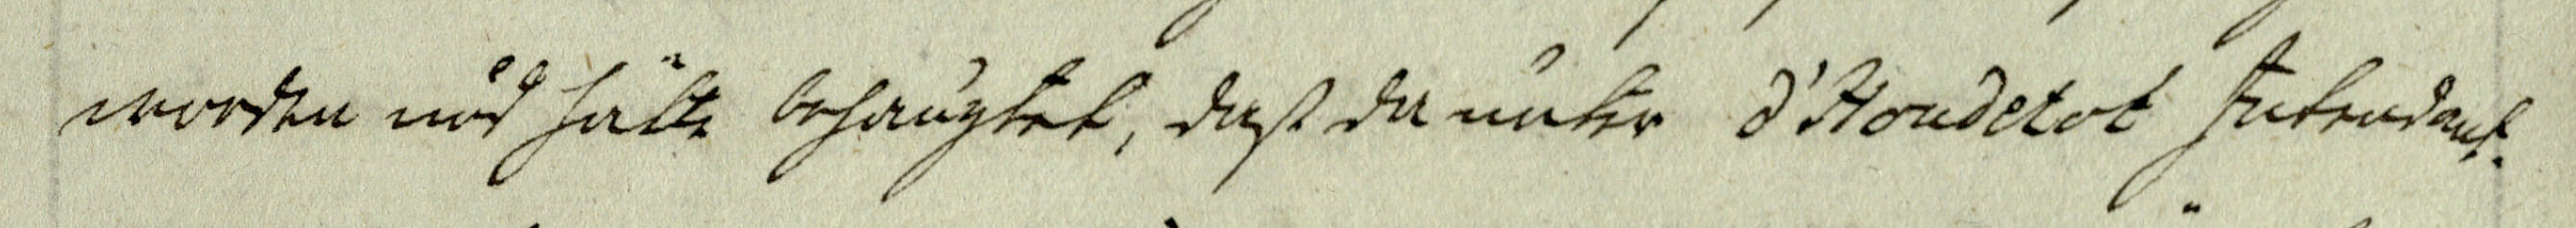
worden und hätte behauptet, daß da unter d' Hondetot Intendant¬
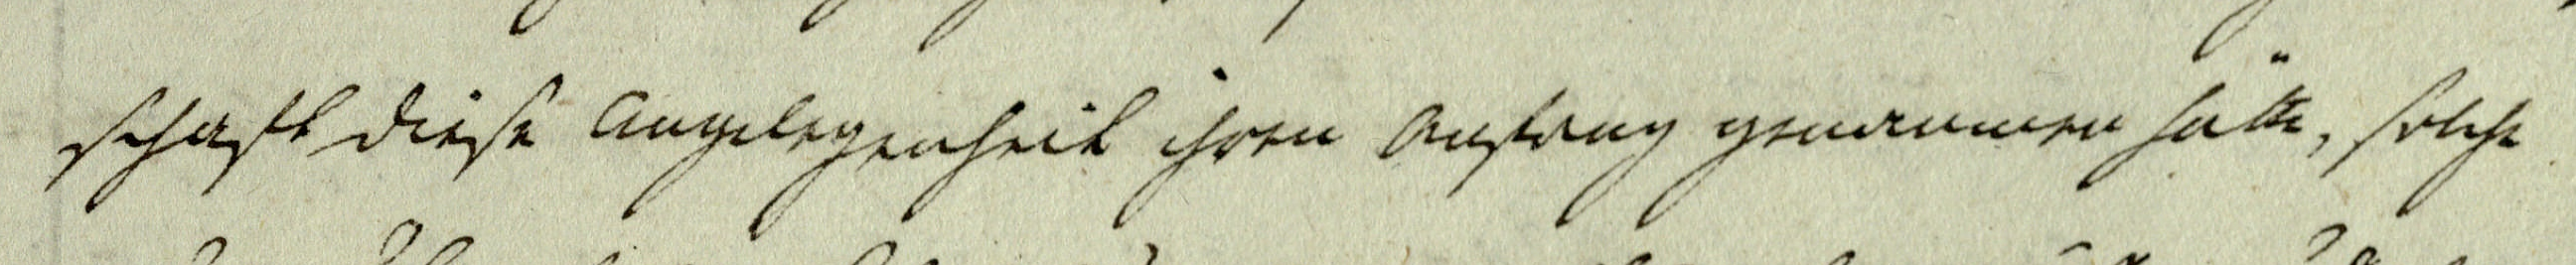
schaft diese Angelegenheit ihren Anfang genommen hätte, solche
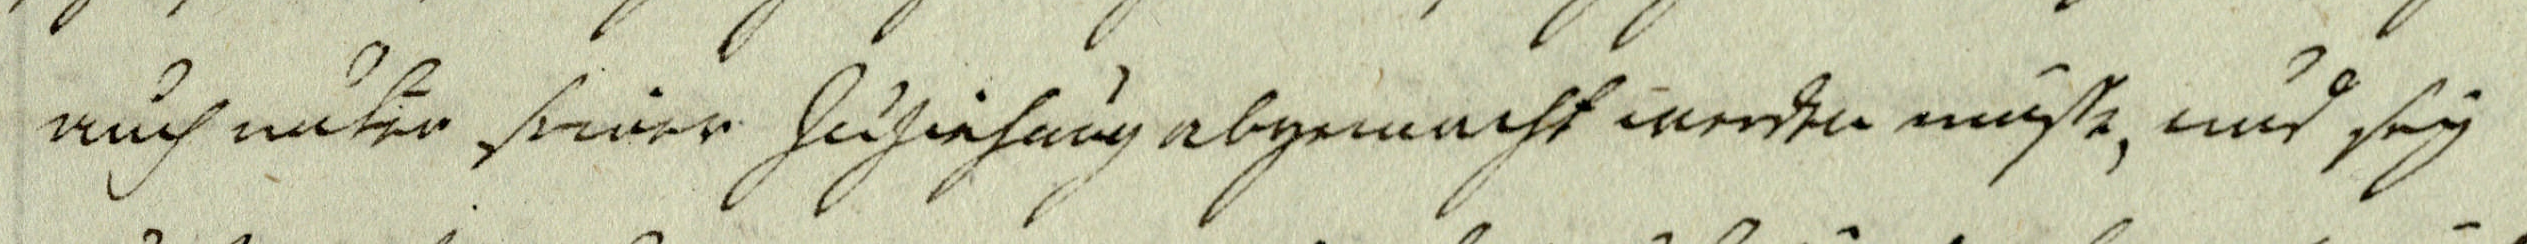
auch unter seiner Zuziehung abgemacht werden müsse, und seÿ
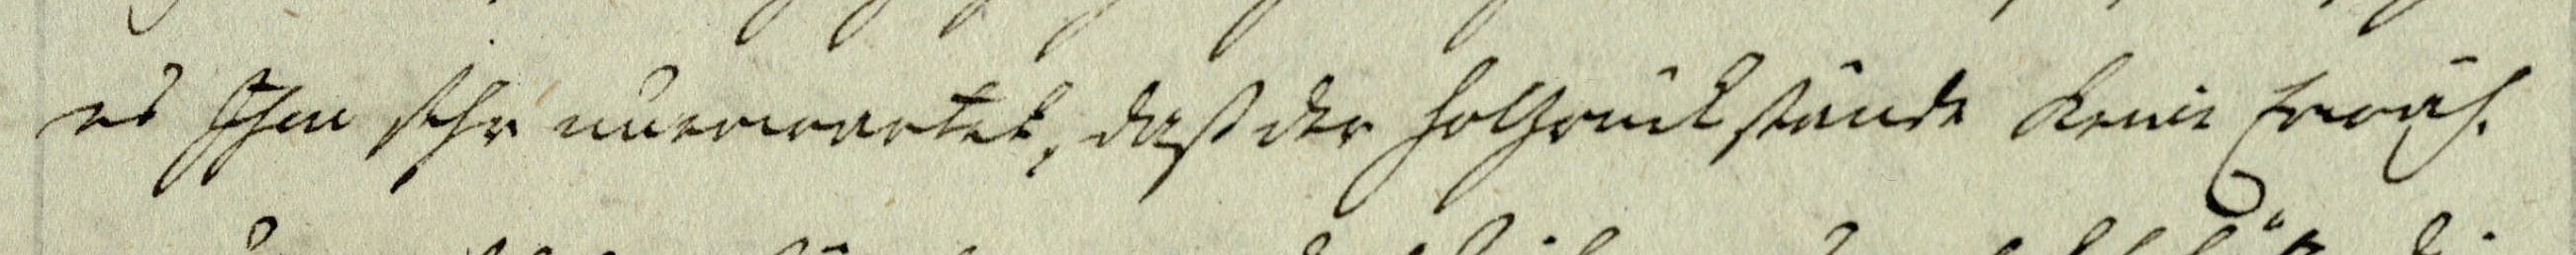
es Ihm sehr unerwartet, daß der Holzrückstände keine Erwäh¬
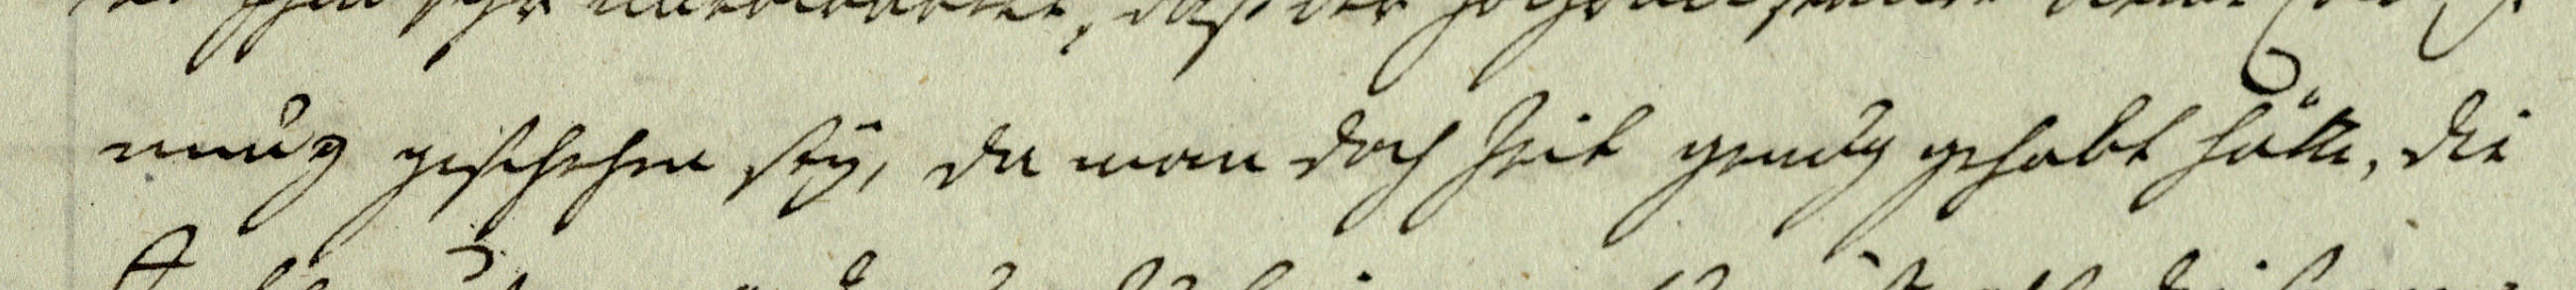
nung geschehen seÿ, da man doch Zeit genug gehabt hätte, die
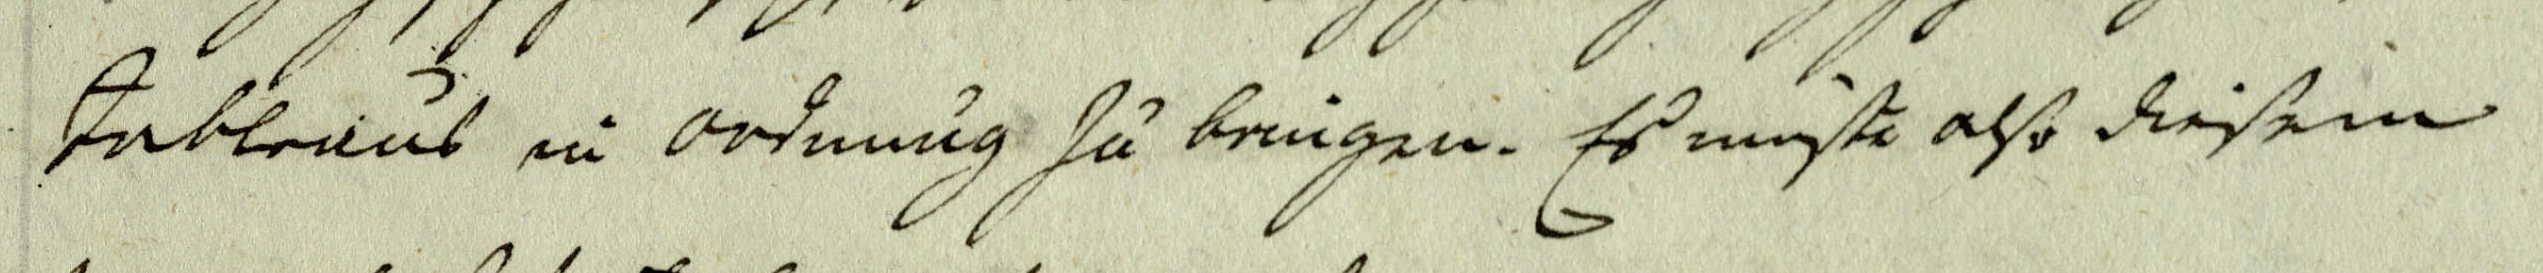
Tableaus in Ordnung zu bringen. Es müste also diesem
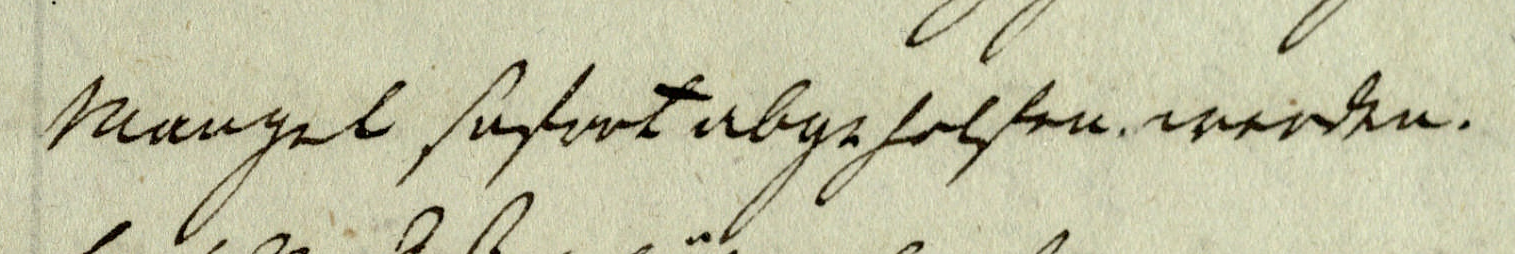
Mangel sofort abgeholfen, werden.
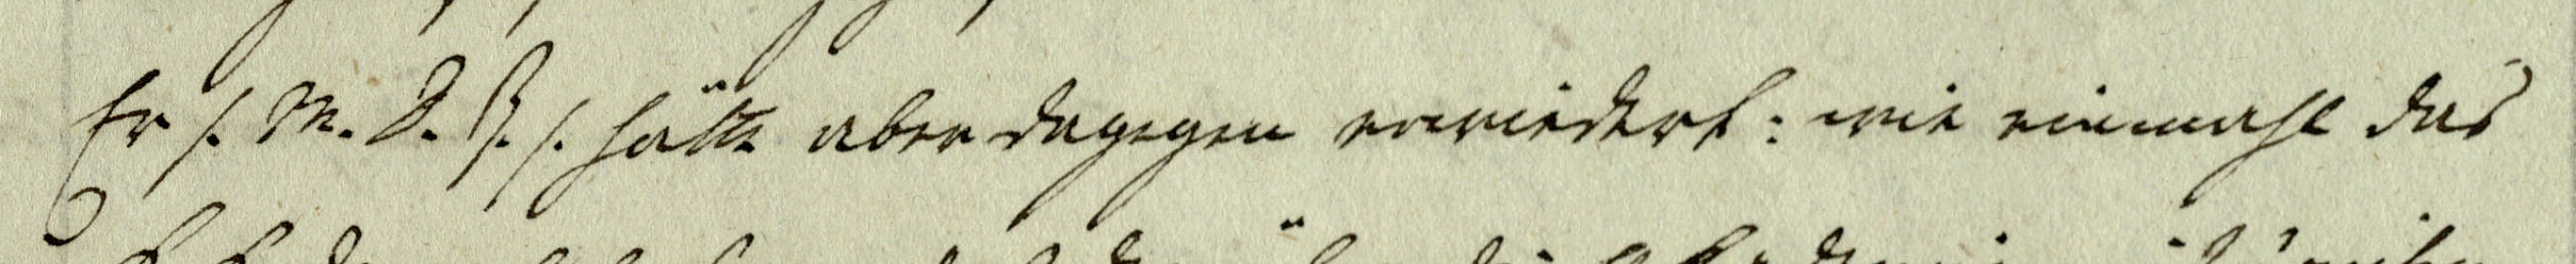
Er /. M. D. R./. hätte aber dagegen erwiedert: wie einmahl das
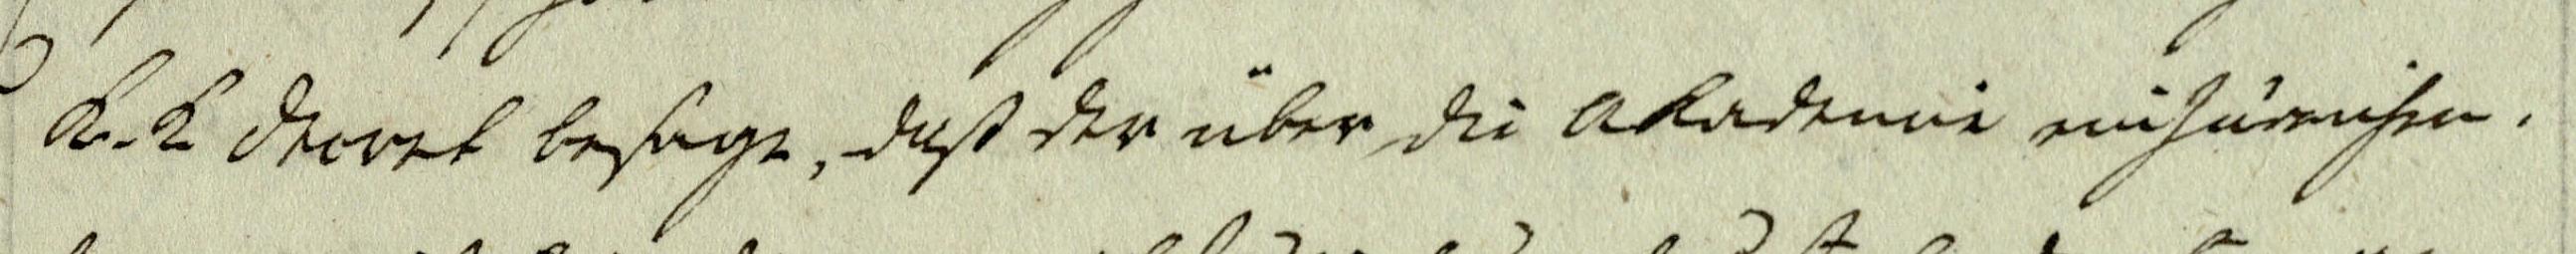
K. K. Decret besage, daß der über die Akademie einzureichen¬
